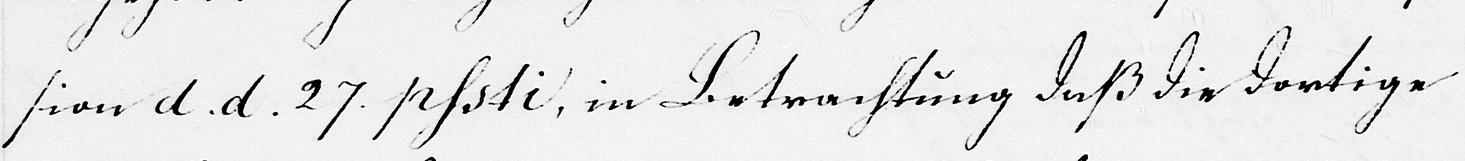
sion d. d. 27. pssti, in Betrachtung daß die dortige
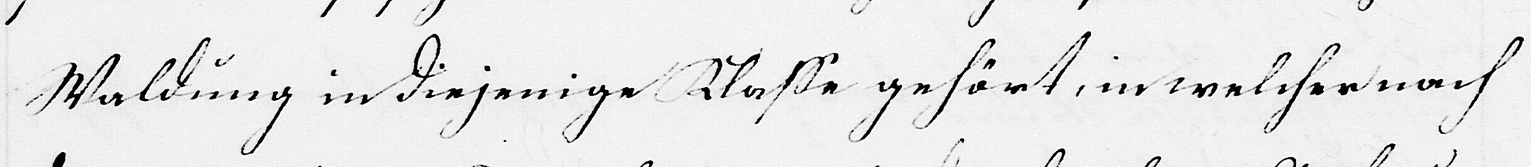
Waldung in diejenige Klaße gehört, in welcher nach
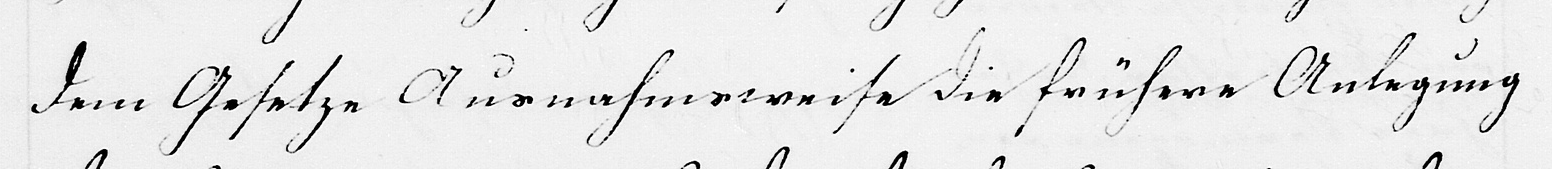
dem Gesetze Ausnahmsweise die frühere Anlegung
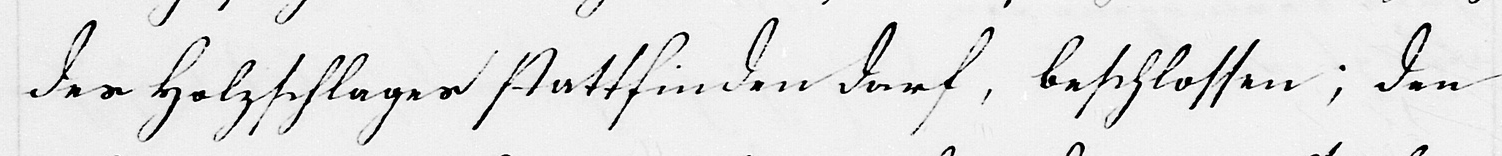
des Holzschlages stattfinden darf, beschlossen; den
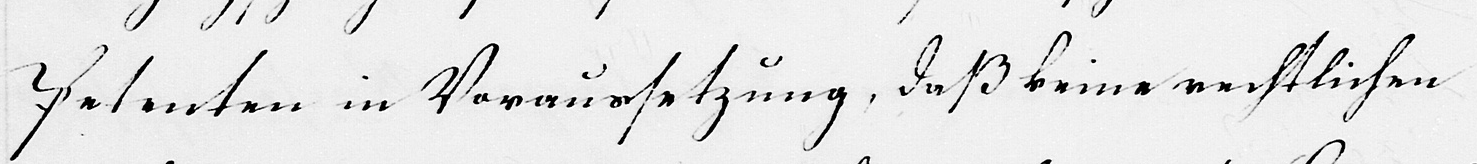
Petenten in Voraussetzung, daß keine rechtlichen
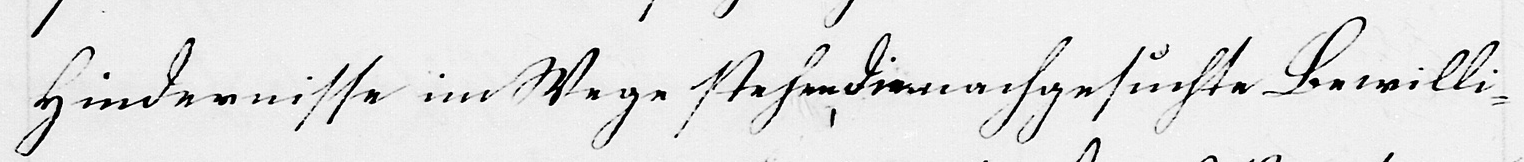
Hindernisse im Wege stehen, die nachgesuchte Bewilli¬
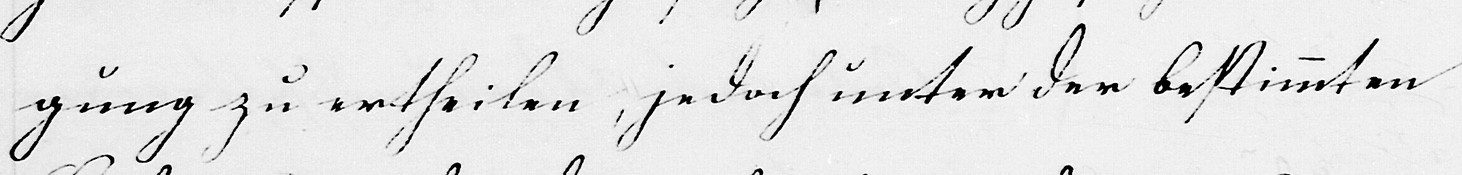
gung zu ertheilen, jedoch unter der bestimmten
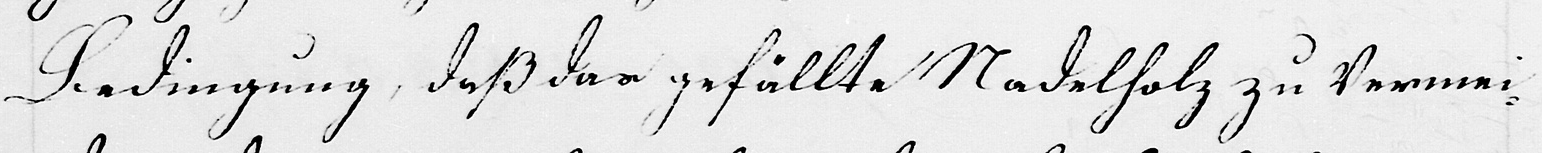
Bedingung, daß das gefällte Nadelholz zu Vermei¬
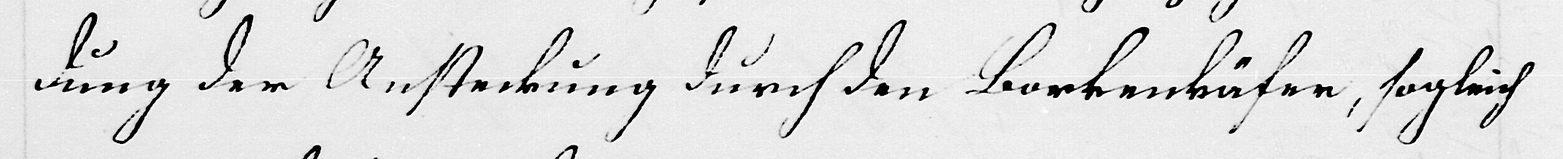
dung der Ansteckung durch den Borkenkäfer, sogleich
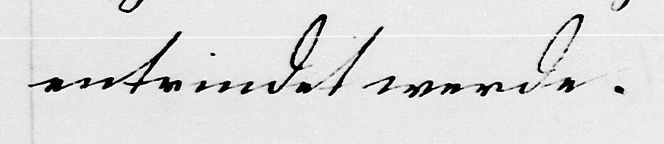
entrindet werde.
